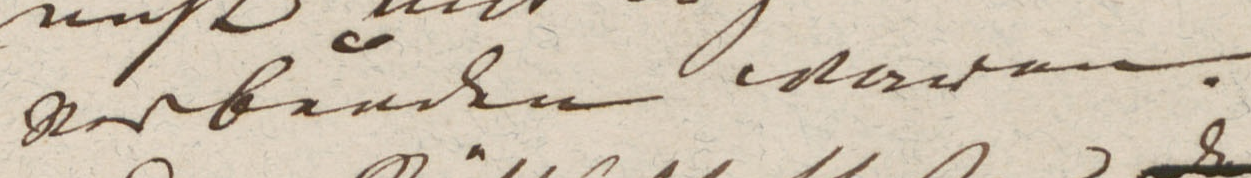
verbunden waren.
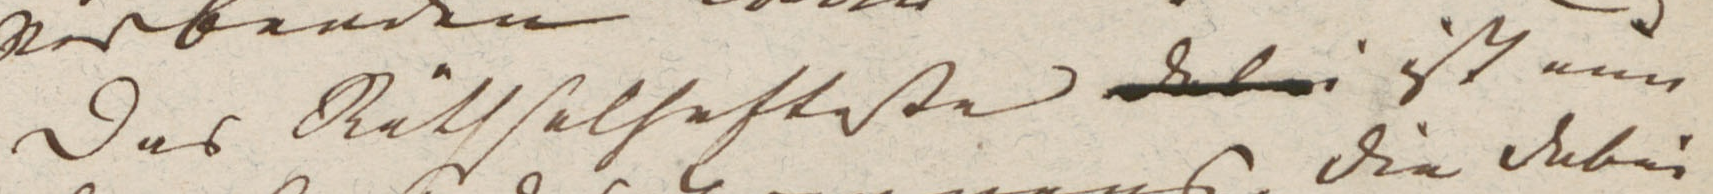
Das Räthselhafteste dabei ist nun
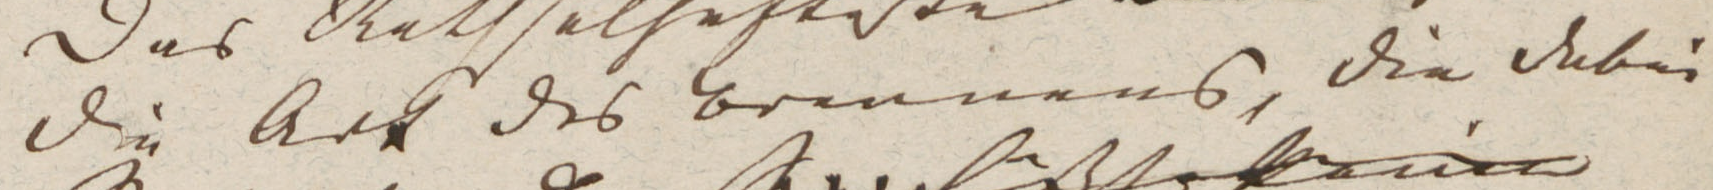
die Art des Brennens, die dabei
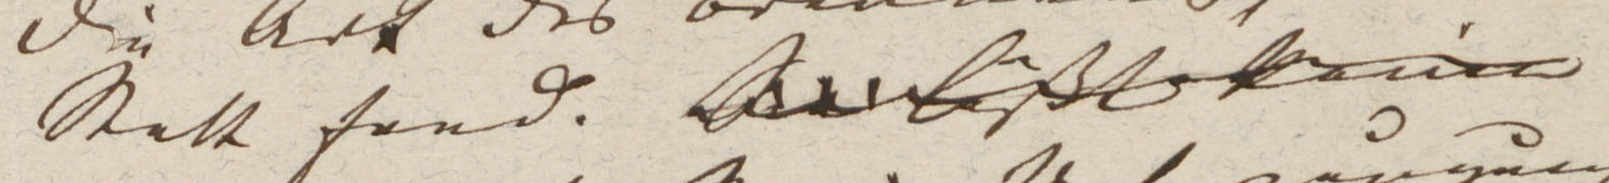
Statt fand. Sie lässt keine
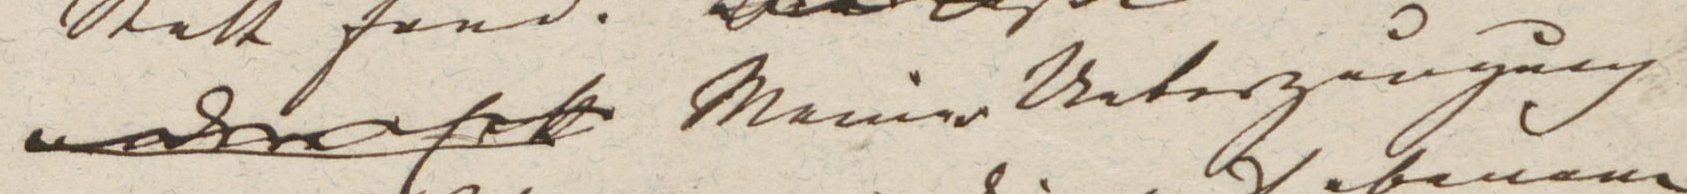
andere Erk Meiner Ueberzeugung
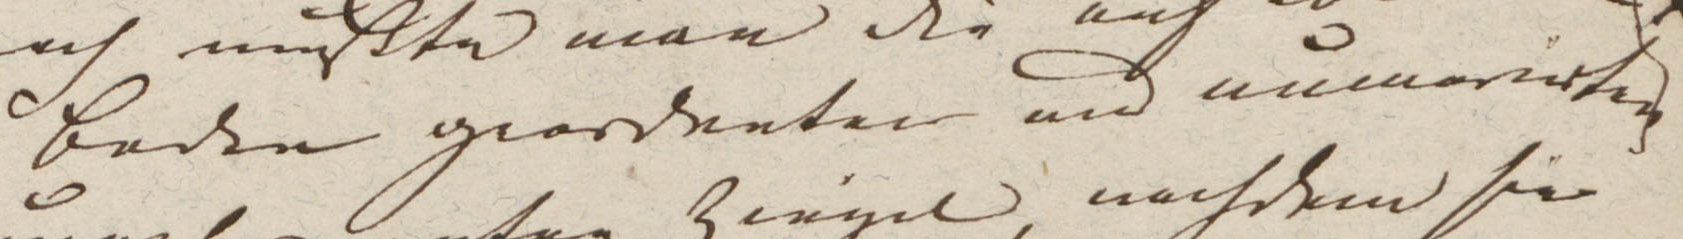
Boden geordneten und numerirten %
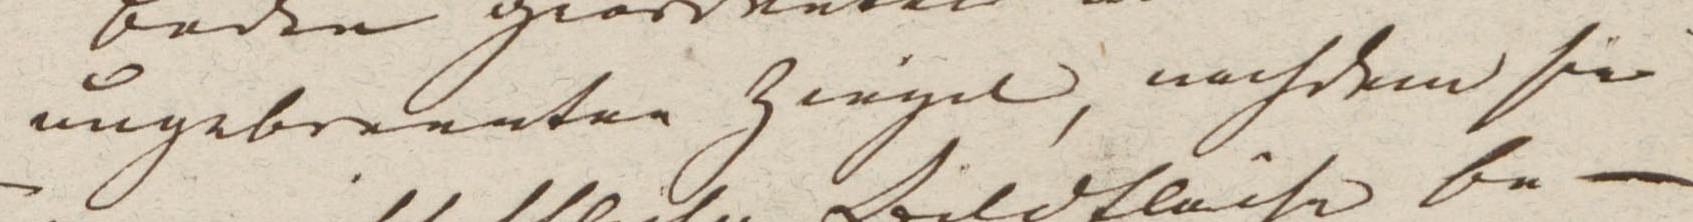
ungebrannten Ziegel, nachdem sie
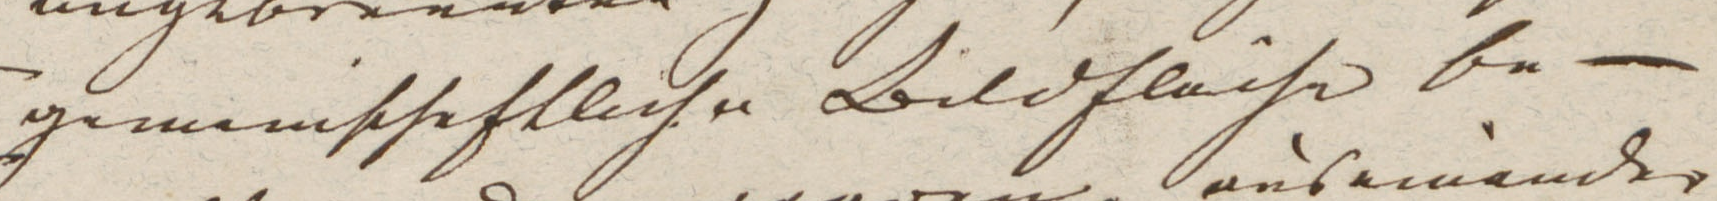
gemeinschaftliche Bildfläche be-
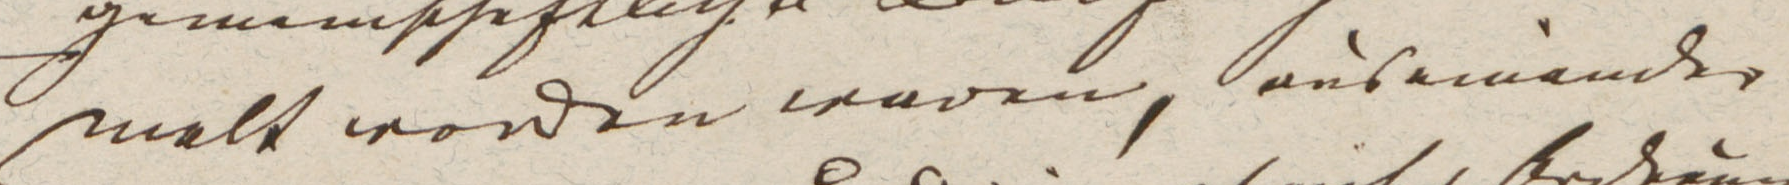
malt worden waren, auseinander
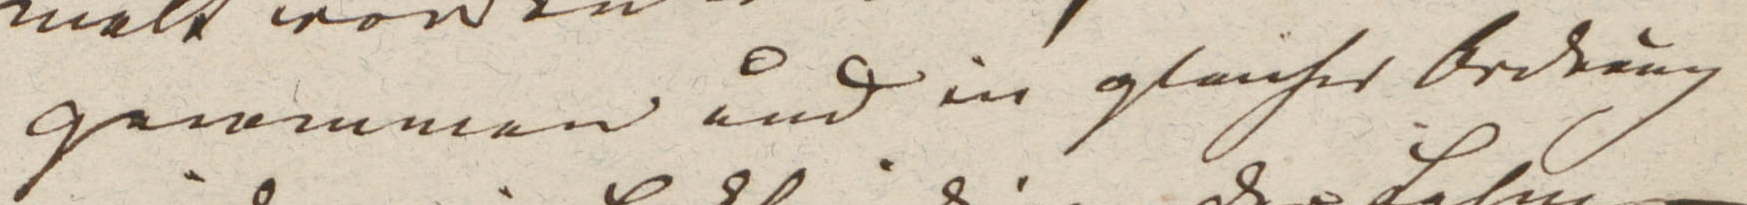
genommen und in gleicher Ordnung
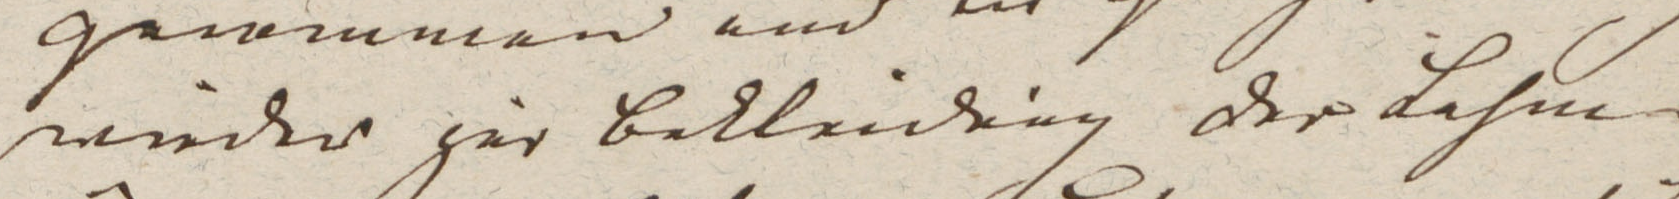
wieder zur Bekleidung der Lehm-
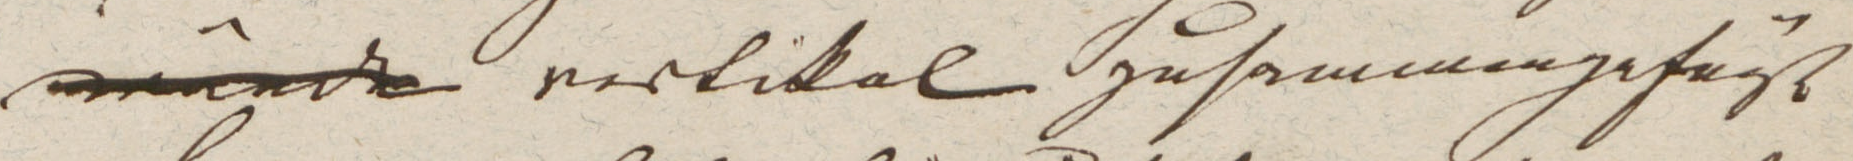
mauern wände vertikal zusammengefügt
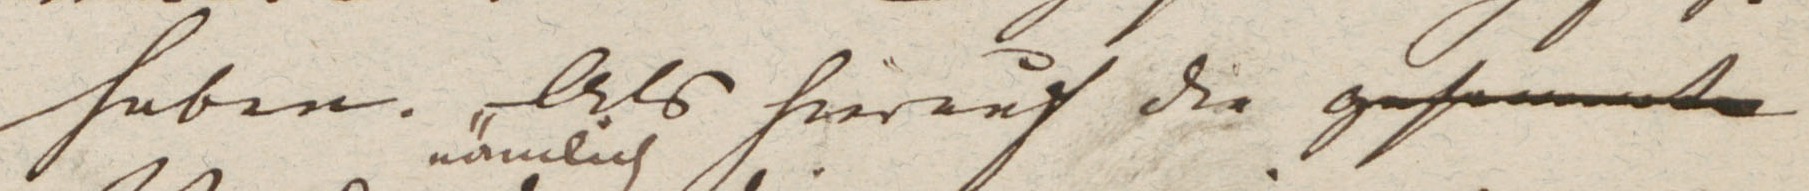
haben. Als hierauf die gesammte
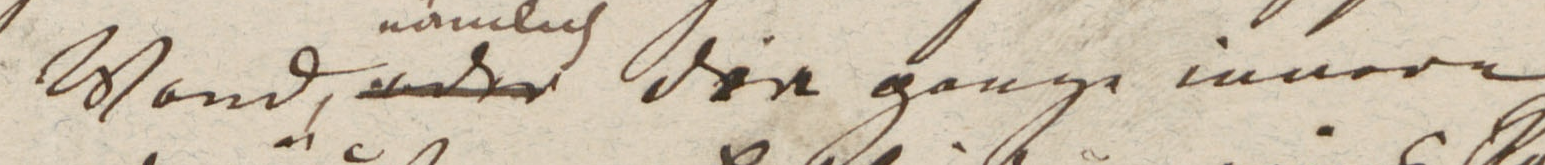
Wand, oder nämlich derie ganze innere
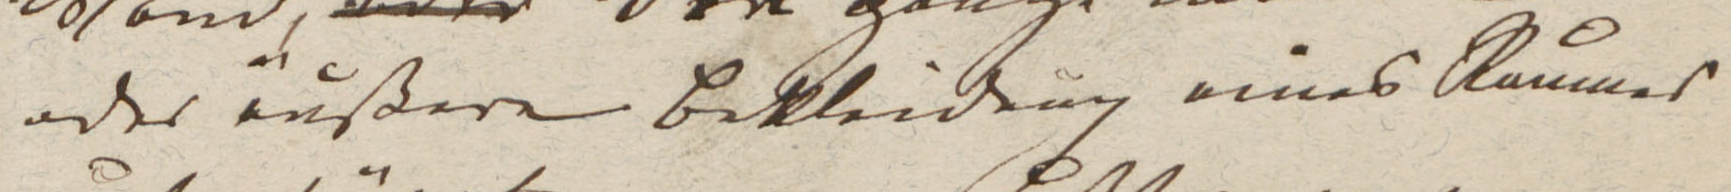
oder äussere Bekleidung eines Raumes
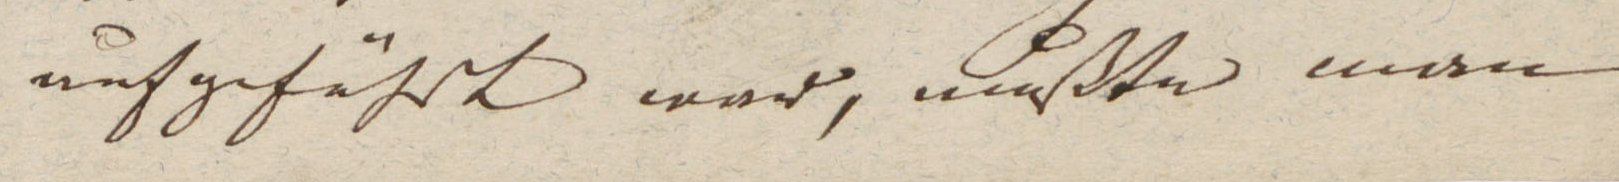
aufgeführt war, musste man
